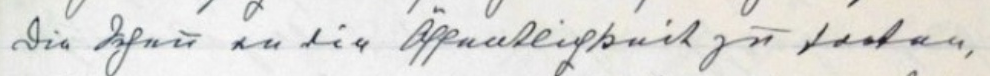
Die Scheu an die Öffentlichkeit zu treten
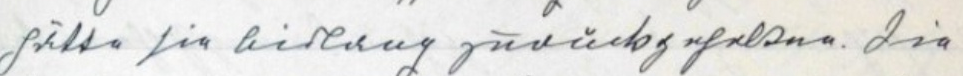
hätte sie bislang zurück gehalten. Sie
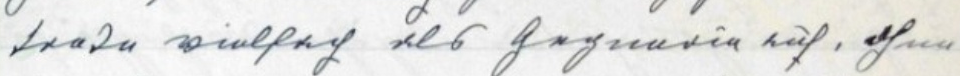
trete vielfach als Gengerin auf, ohne
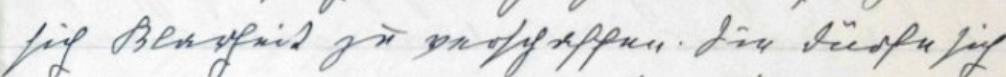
sich Klarheit zu verschaffen. Sie dürfe sich
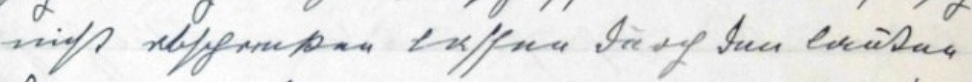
nicht abschrecken lassen durch den lauten Kampf
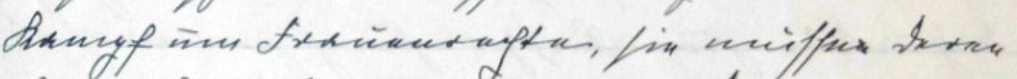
um Frauenrechte. Sie müsse deren
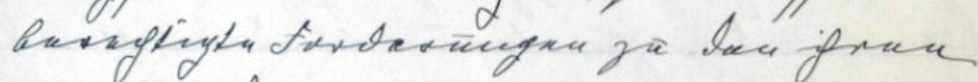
berechtigte Forderungen zu den ihren
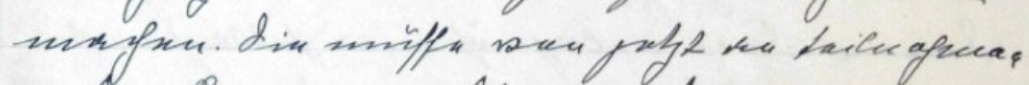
machen. Sie müsse von jetzt an teilnehmen
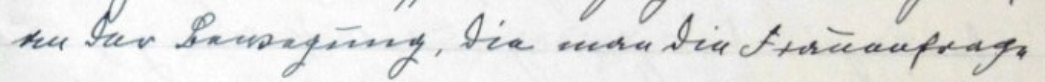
an der Bewegung, die man die Frauenfrage
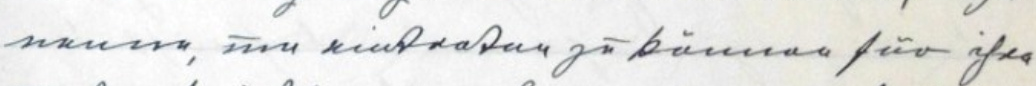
nenne, um eintreten zu können für ihre
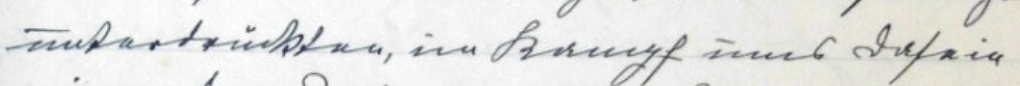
unterdrückten, im Kampf ums Dasein
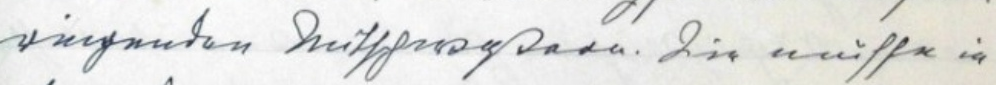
ringenden Mitschwestern. Sie müsse in
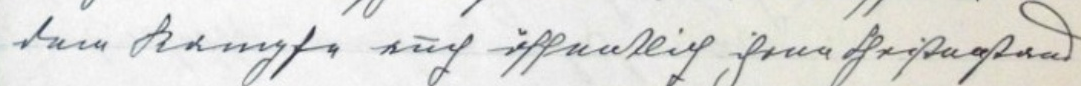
dem Kampfe auch öffentlich ihren Christenstand
